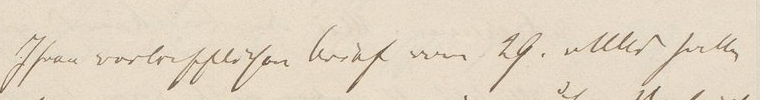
Ihren vortrefflichen Brief vom 29. vMts hatte
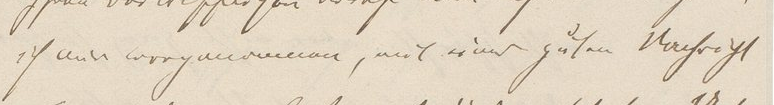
ich mir vorgenommen, mit einer guten Nachricht
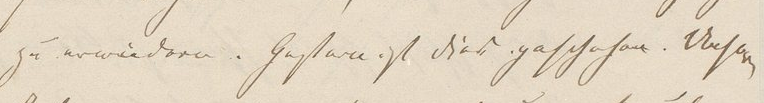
zu erwiedern. Gestern ist dies geschehen. Unsere
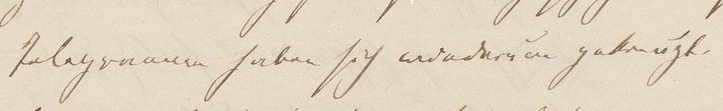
Telegramme haben sich wiederum gekreuzt.
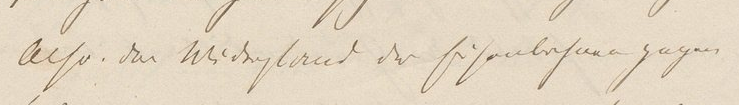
Also der Widerstand der Eisenbahnen gegen
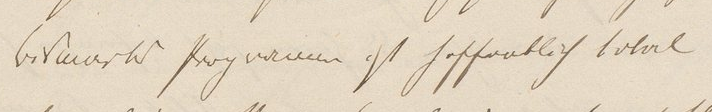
Bismarks Programm ist hoffentlich total
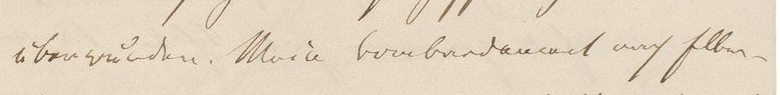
überwunden. Mein Bombardement nach Elber-
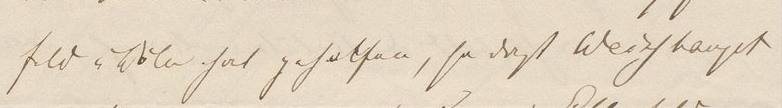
feld u Cöln hat geholfen, so daß Weisshaupt
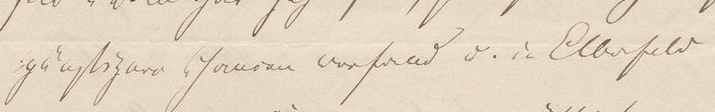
günstigere Chancen vorfand u. in Elberfeld
